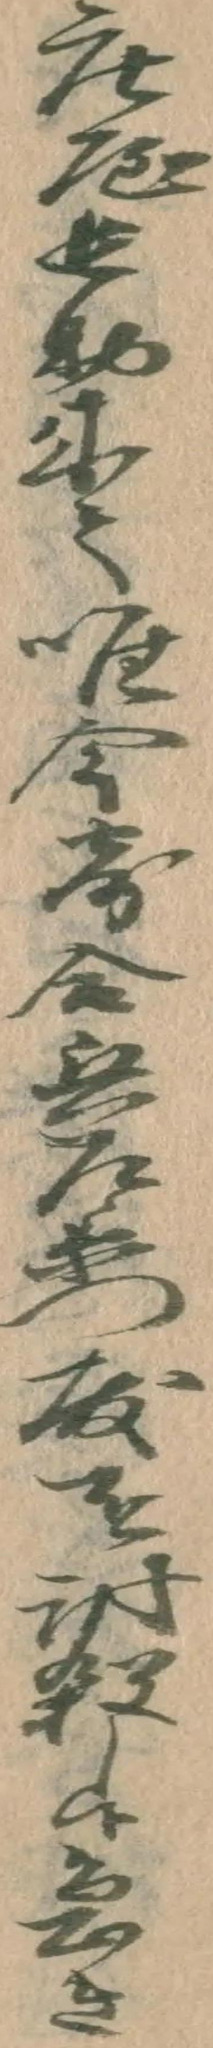庄屋長助来て唯今寄合兵左衛門殿を討殺し候急き
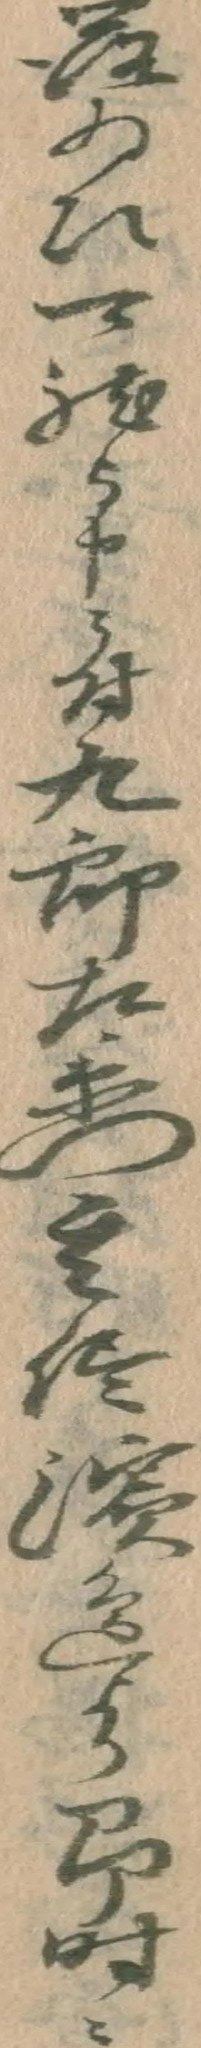落給ひ可然与申に付九郎左衛門其侭浜辺より即時に
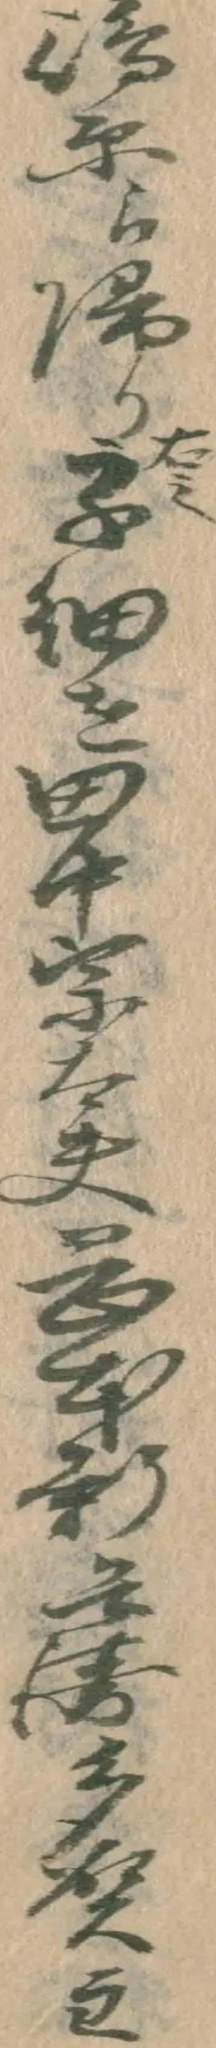島原え帰り右之子細を田中宗太夫岡本新兵衛多賀主
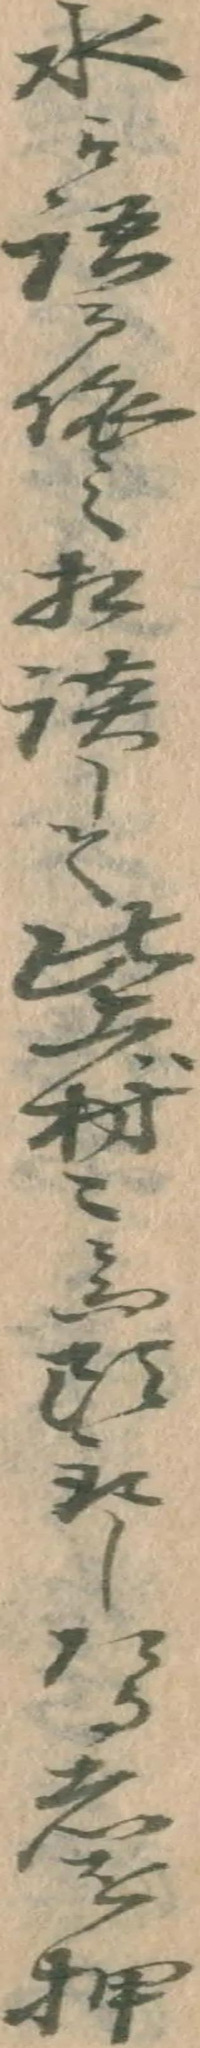水え語る依之相談して此上は村々に而頭取したる者を押
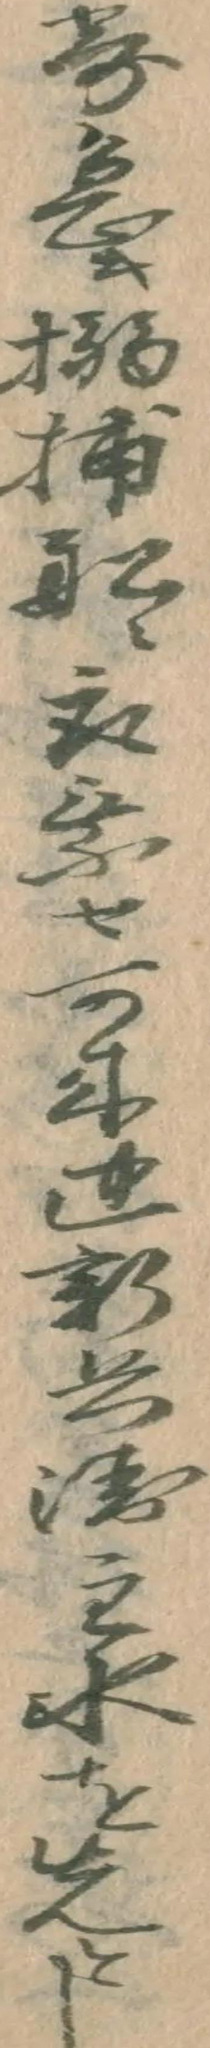寄急き搦船に取乗せ可来迚新兵衛主水を先とし
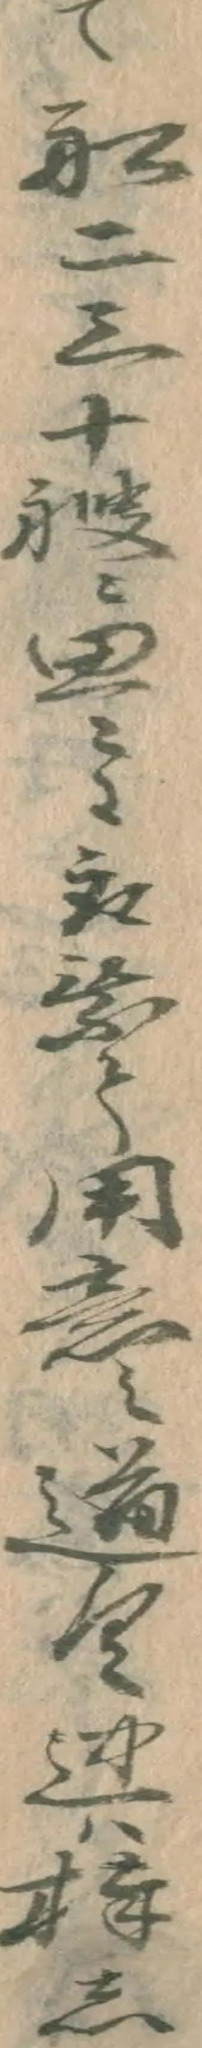て船二三十艘に思々に取乗て用意之道具迚は棒し

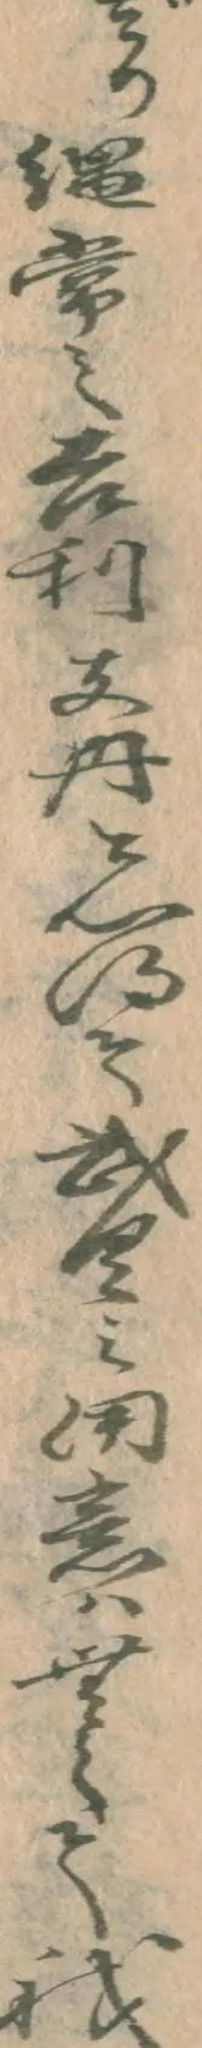ばり縄常之吉利支丹と心得て武具之用意は無之て我
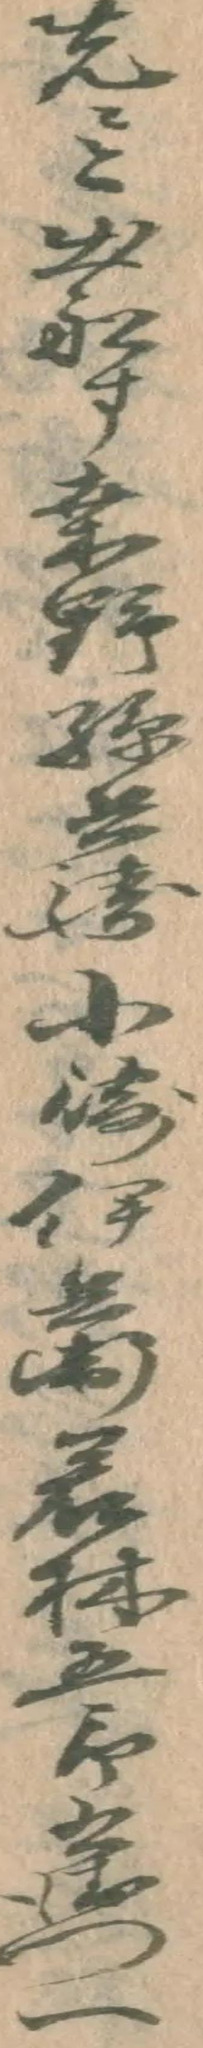先にと出船す桑野孫兵衛小崎伊兵衛若林五郎右衛門一
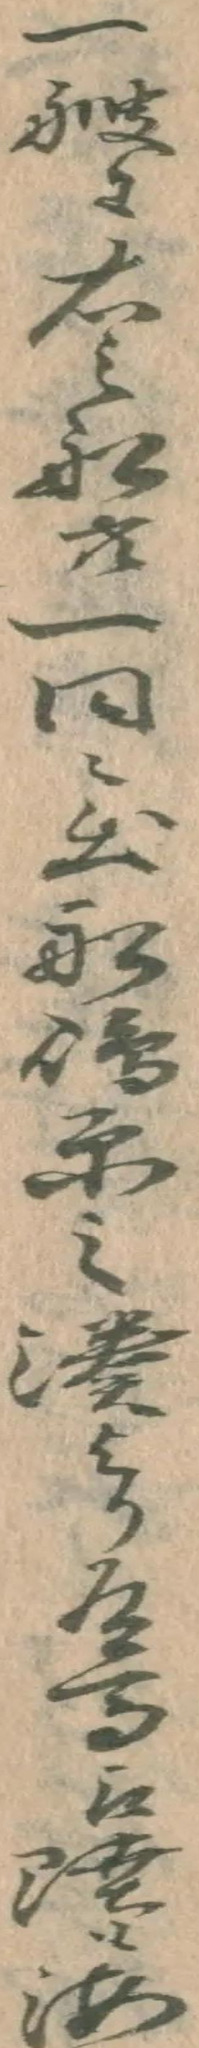一艘に右之船共一同に出船島原之湊より有馬え陸も海
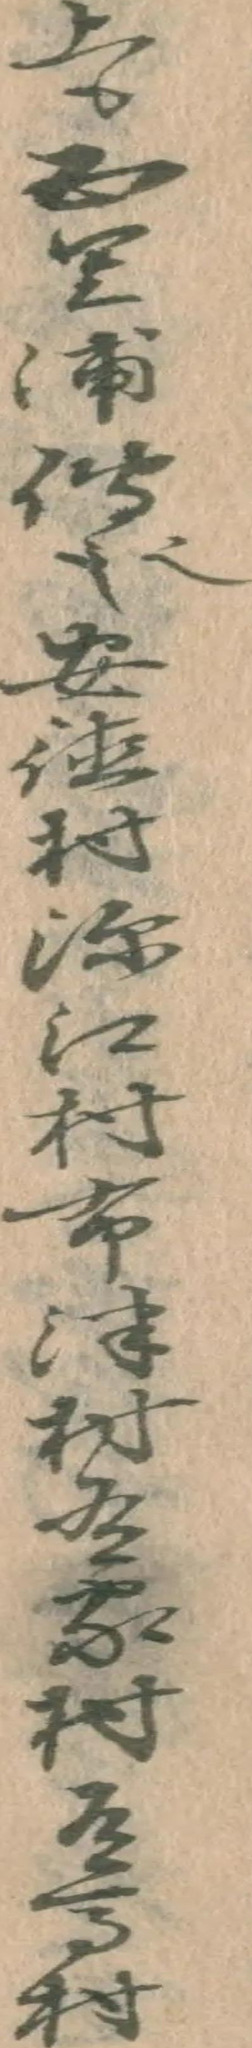上も五里浦伝也安徳村深江村布津村有家村有馬村
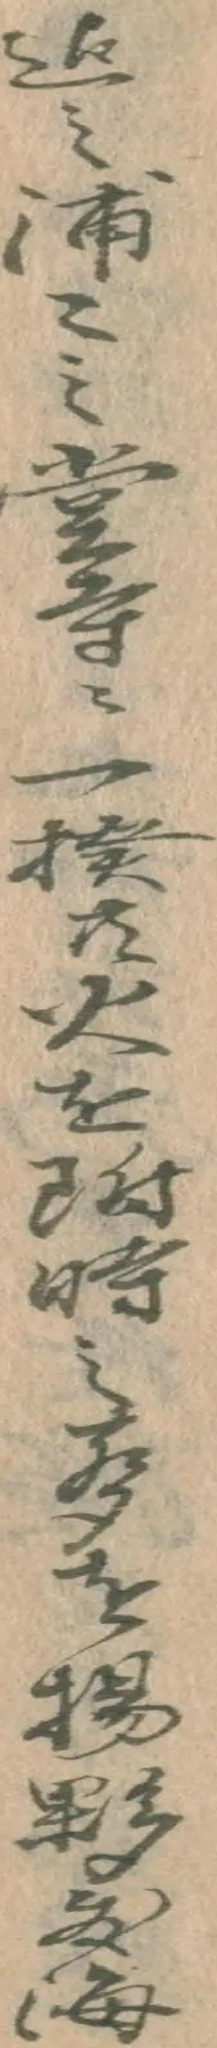迄之浦々之堂寺に一揆共火を附時之声を揚夥敷海
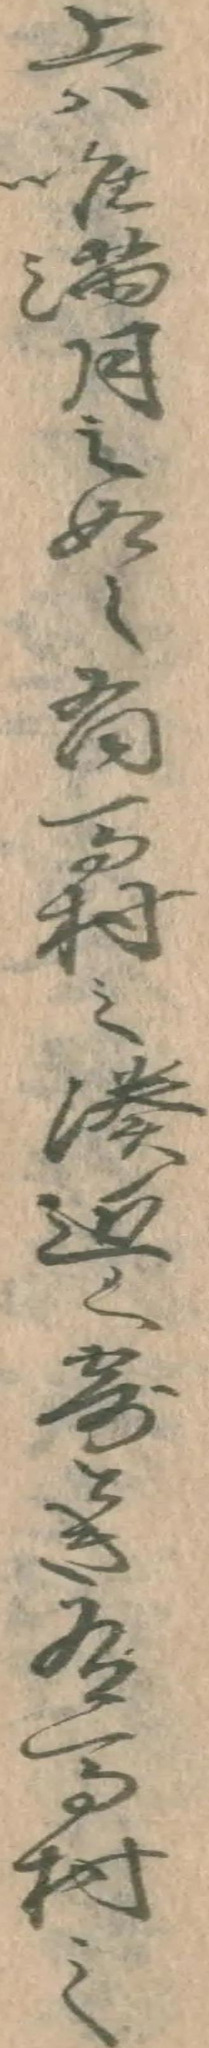上は唯満月之如し有馬村之湊近く寄とき有馬村之
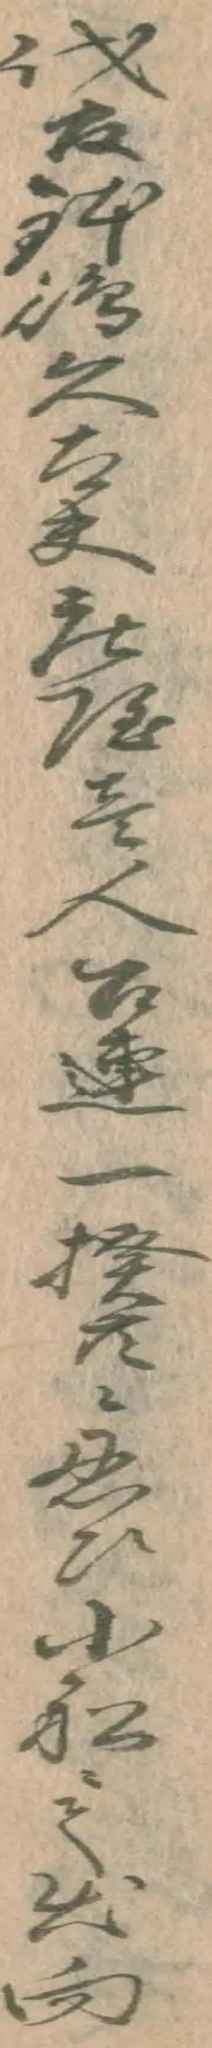代官鉢島久太夫庄屋壱人召連一揆共に忍ひ小船にて出向
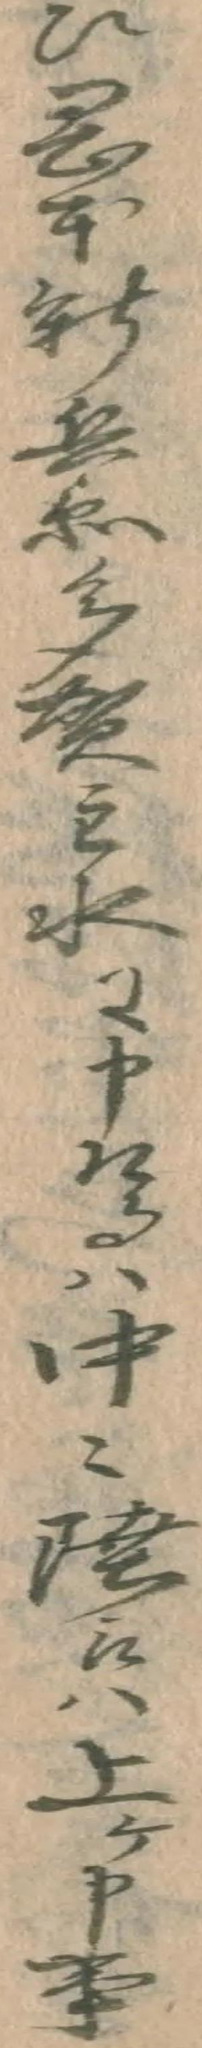ひ岡本新兵衛多賀主水に申けるは中々陸えは上け申事
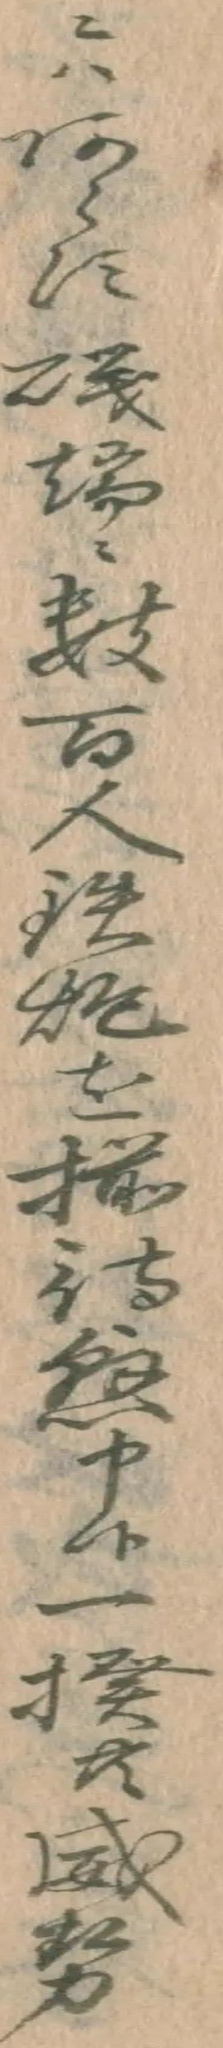にはあらす磯端に数百人鉄炮を揃待懸申候一揆共威勢
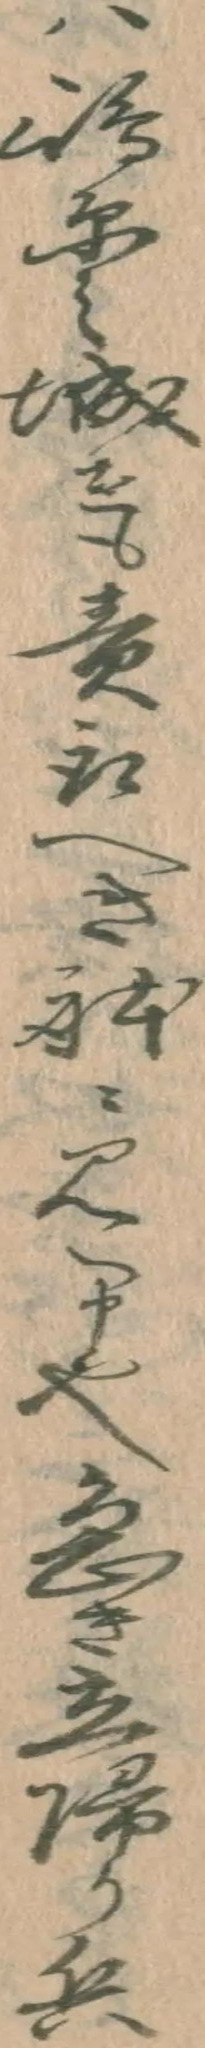は島原之城をも責取へき体に見へ申也急き立帰り兵
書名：切支丹御退治記 49巻. [1]
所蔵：国立国会図書館 National Diet Library, JAPAN
